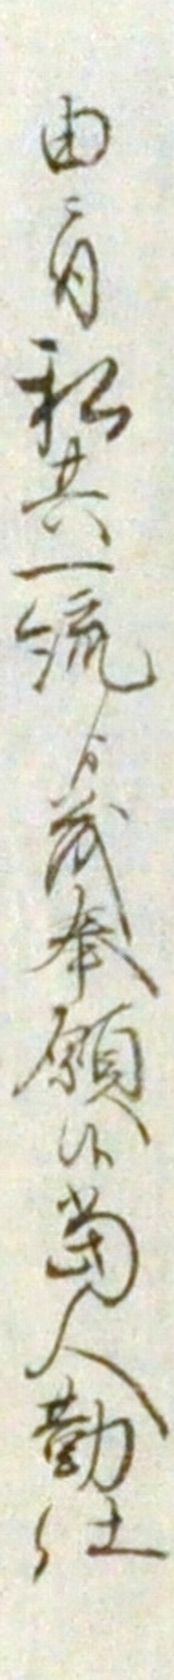由ニ付私共一統ゟ茂奉願候当人勤仕
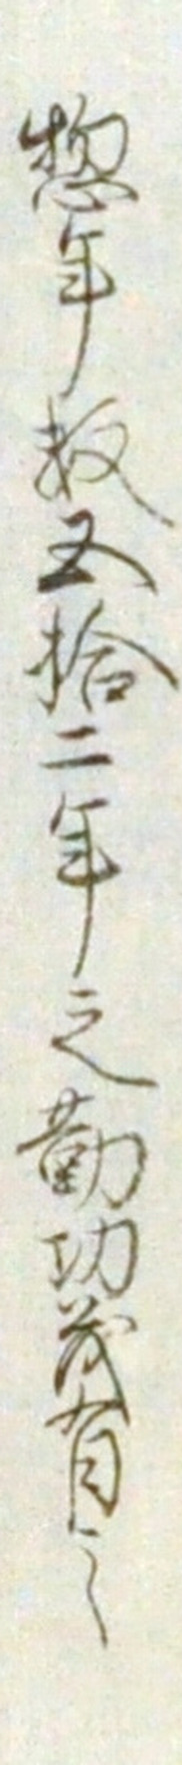惣年数五拾二年之勤功茂有之
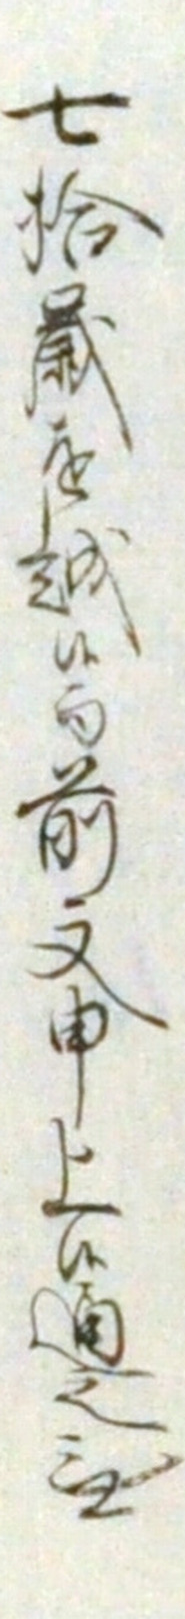七拾歳を越候而前文申上候通之無
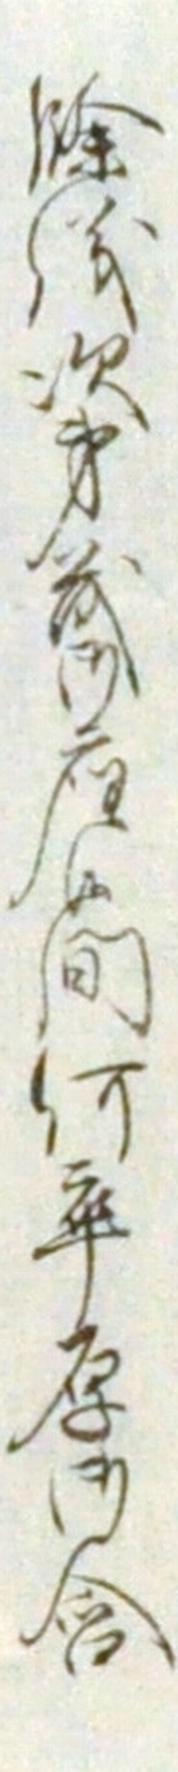除儀次第茂御座候間何卒厚御含
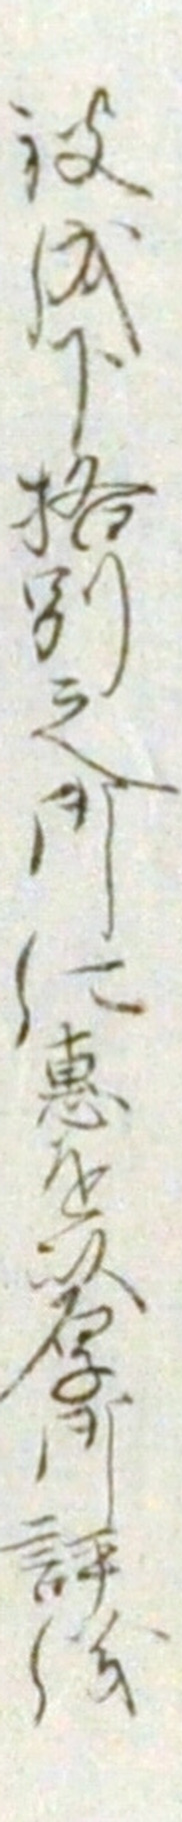致成下格別之御仁恵を以厚御評儀
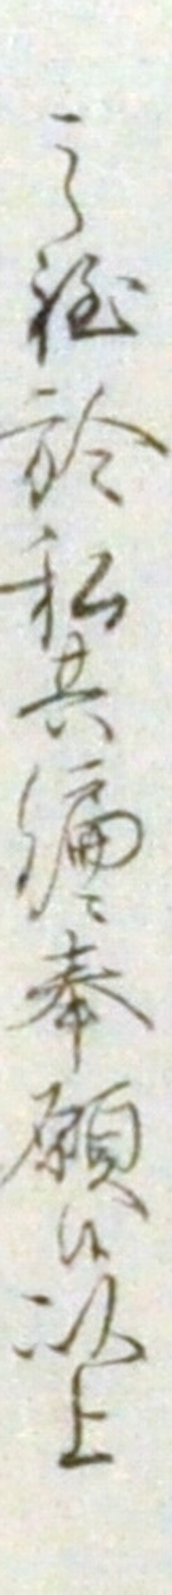至極於私共偏ニ奉願候以上
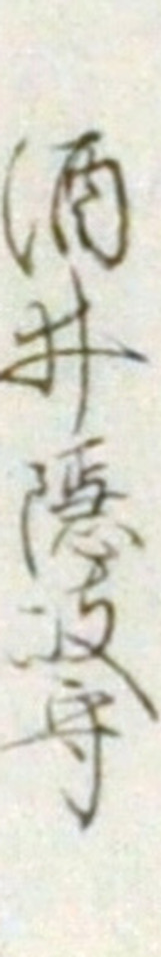酒井隠岐守
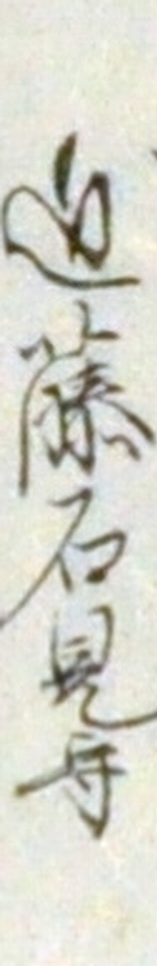近藤石見守

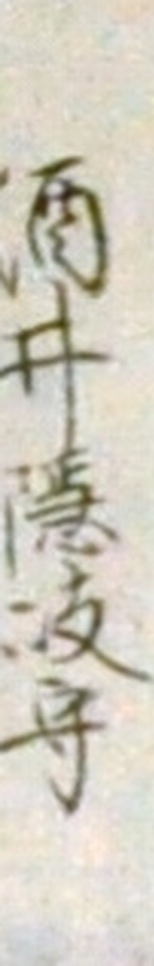酒井隠岐守
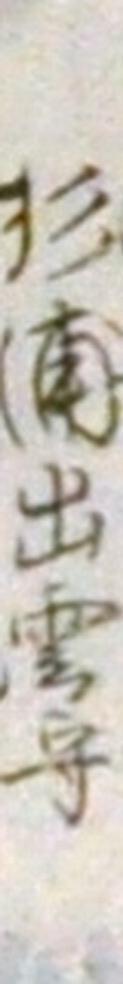杉尾出雲守
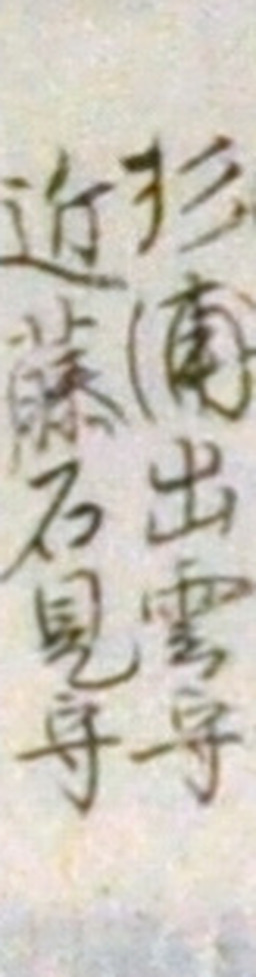近藤石見守

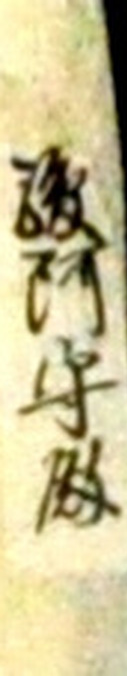駿河守殿
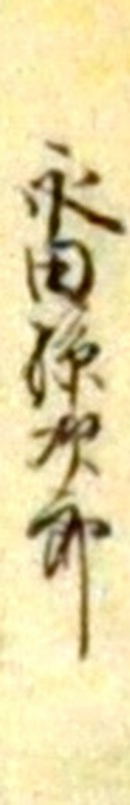永田孫次郎

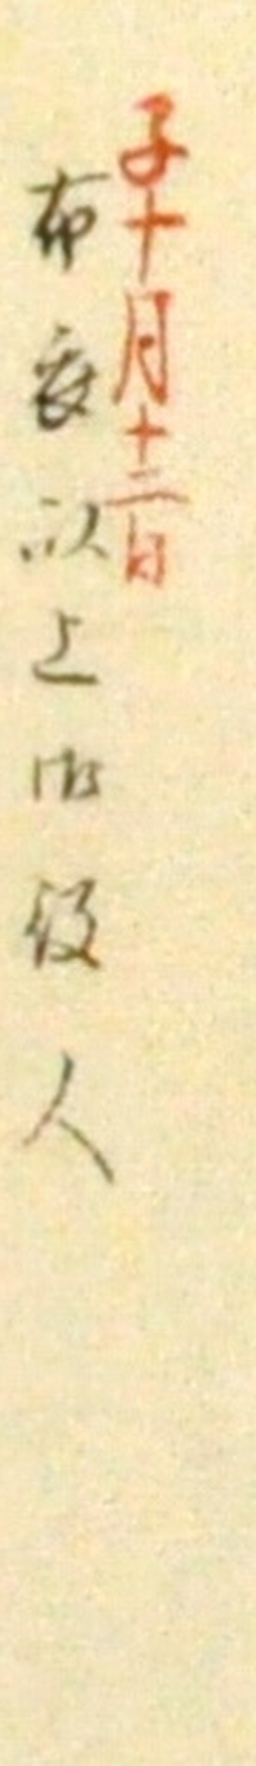布衣以上御役人
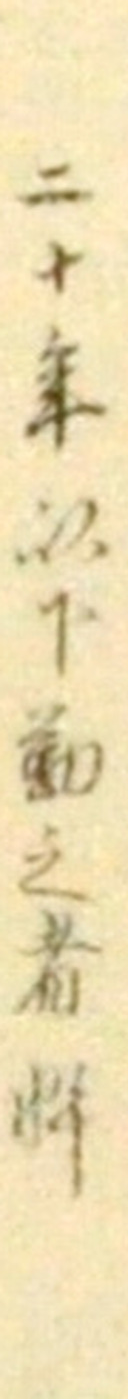二十年以下勤之者忰
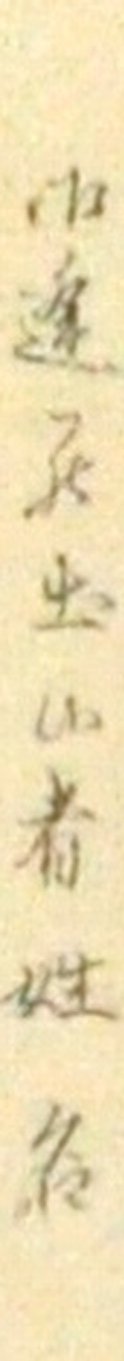御逢罷出候者姓名
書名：若年寄御役中之御書物〔一括〕
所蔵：伊那市立高遠町図書館・合同会社AMANE
